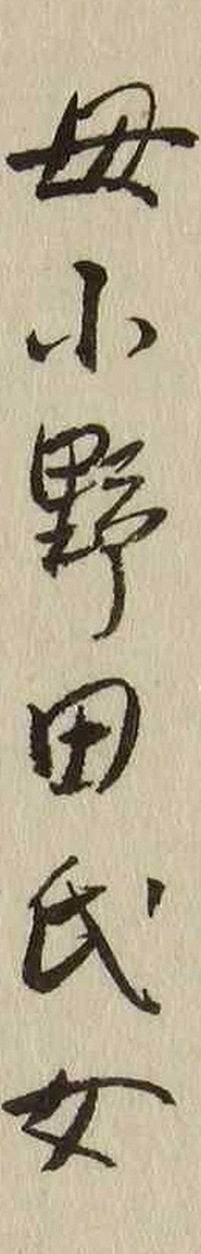母小野田氏女
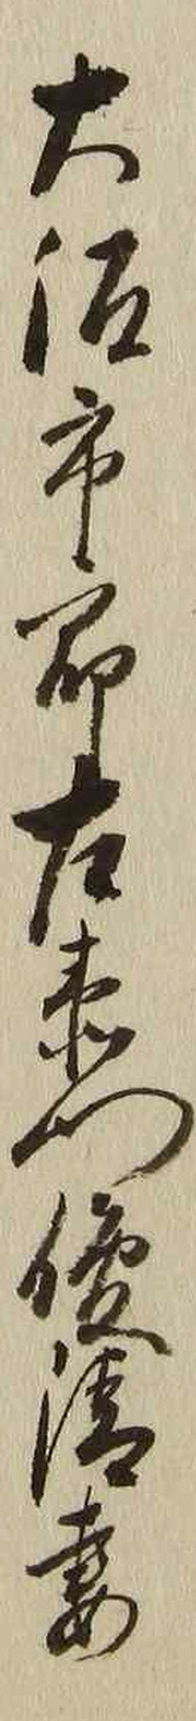女大沼市郎左衛門俊清妻
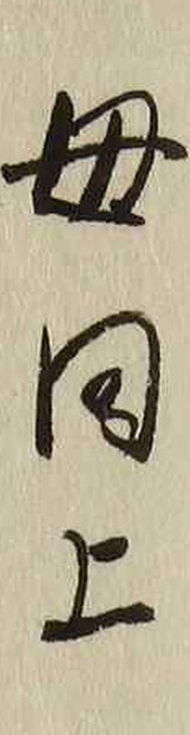母同上
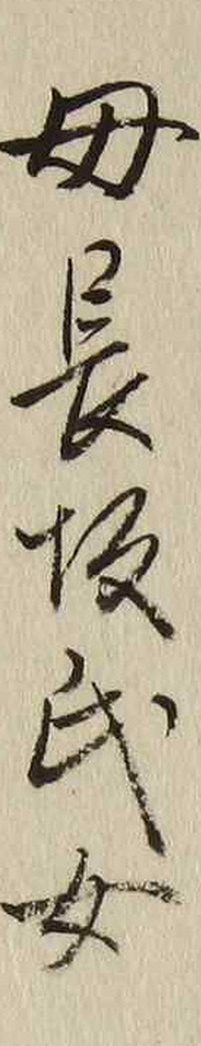母長坂氏女
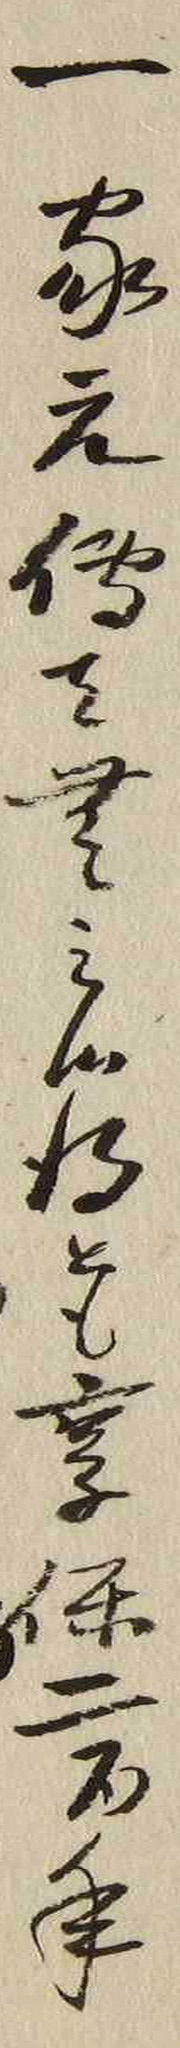一家元伝者無之候得とも享保二酉年
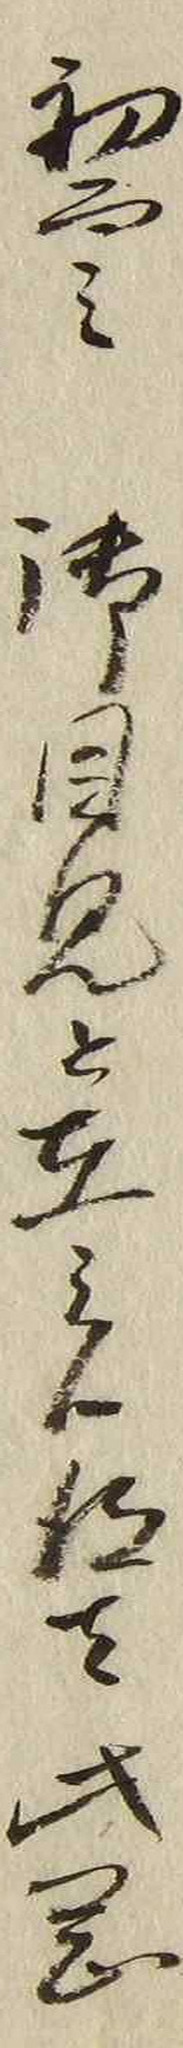初而之御目見と在之候得者此岡
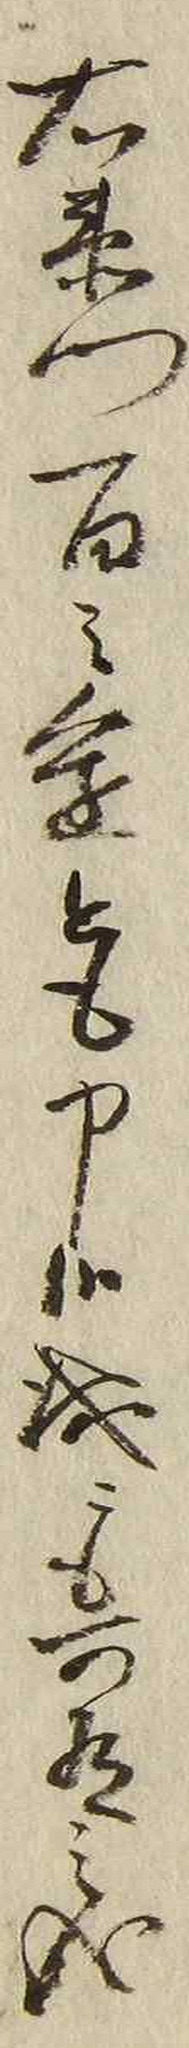右衛門百之進とも申候儀ニも可有之哉

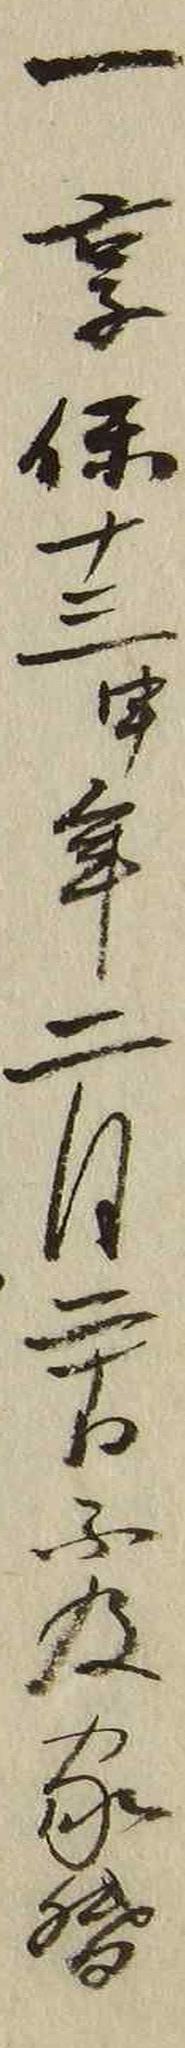一享保十三申年二月二十日不及家督
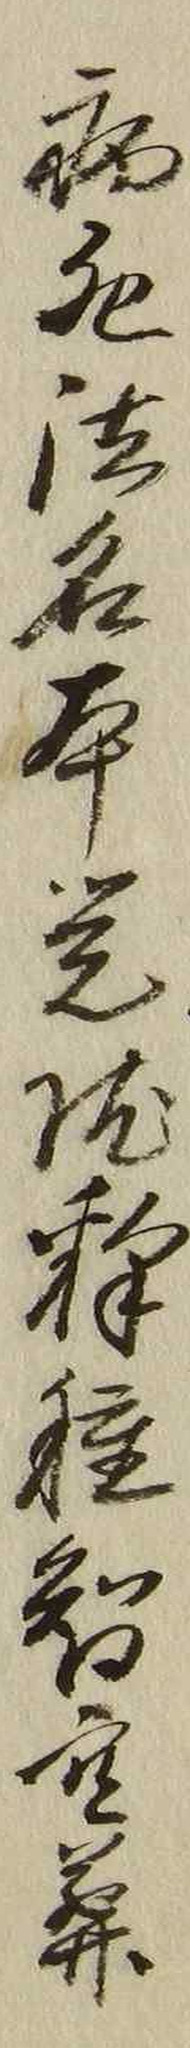病死法名本覚院釈種智空葬
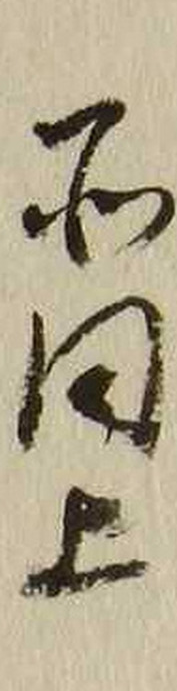所同上
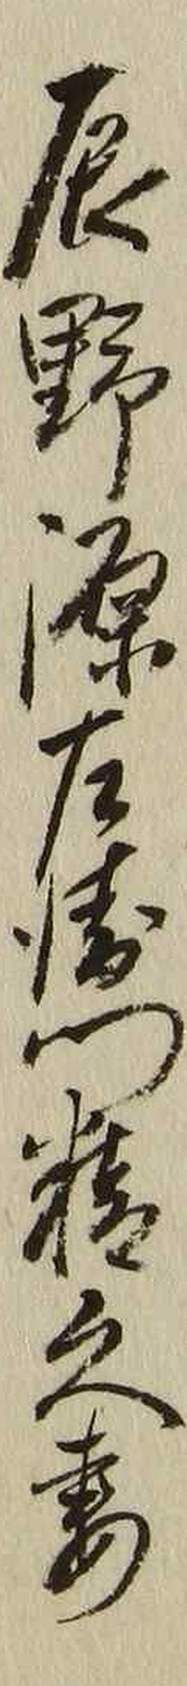女辰野源左衛門精久妻
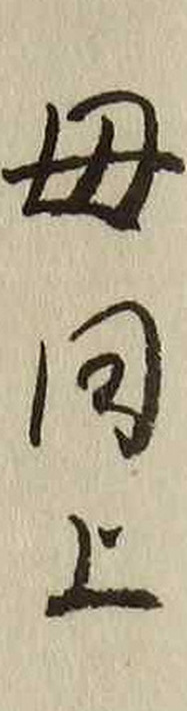母同上
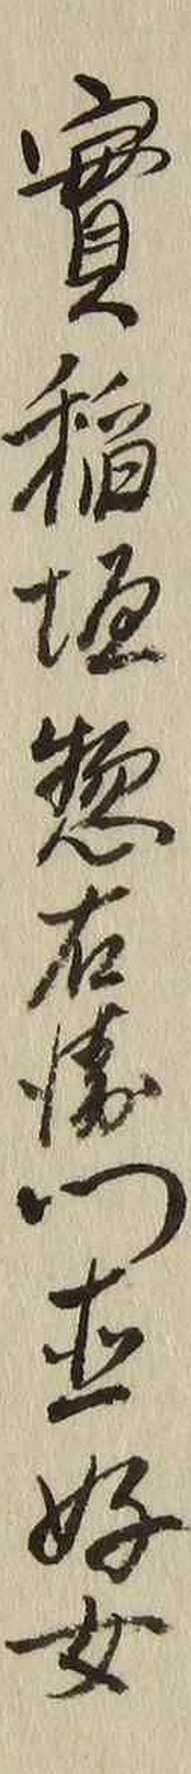実稲垣惣右衛門直好女
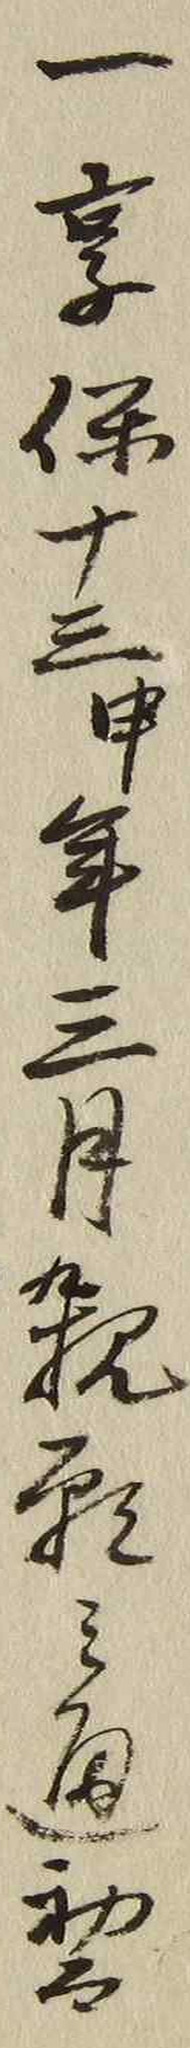一享保十三申年三月親願之通初而
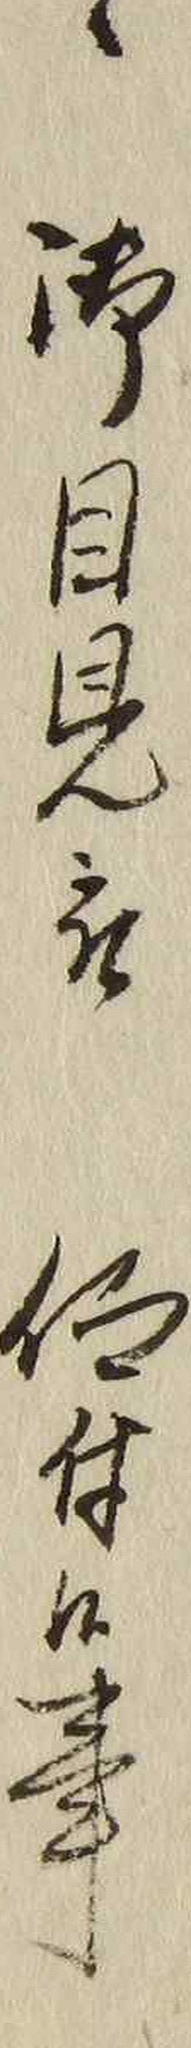之御目見被仰付候事
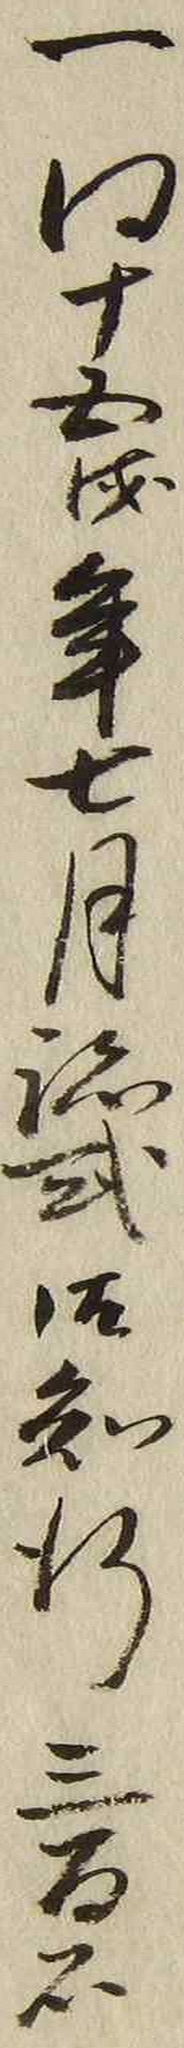一同十五戌年七月跡式御知行三百石
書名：諸士系譜　巻之356　す之部6
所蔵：会津若松市立会津図書館
